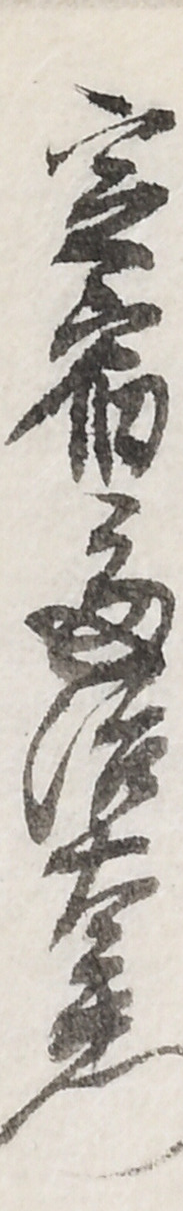定宿多治右衛門
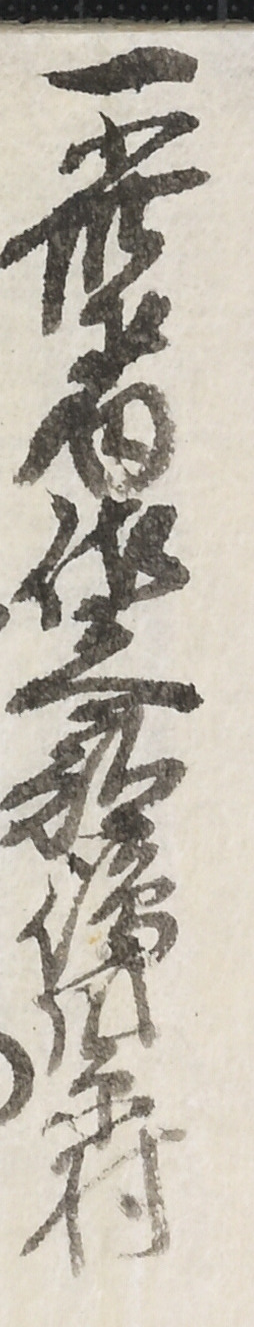一此者佐久郡島川原村
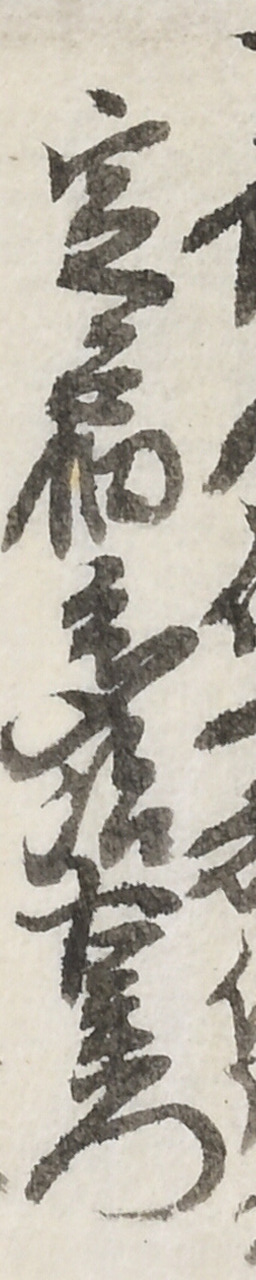定宿多治右衛門
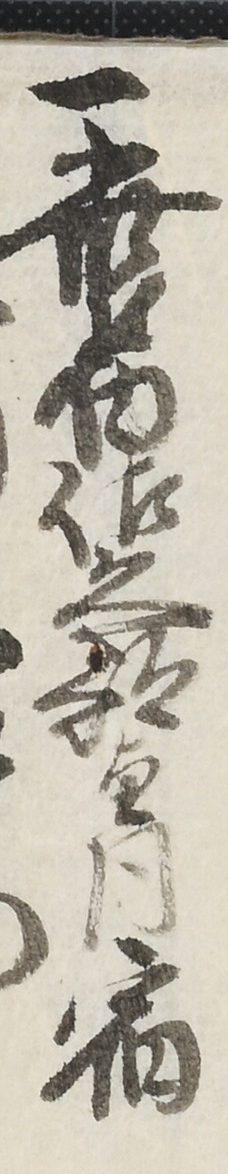一此者佐久郡望月宿
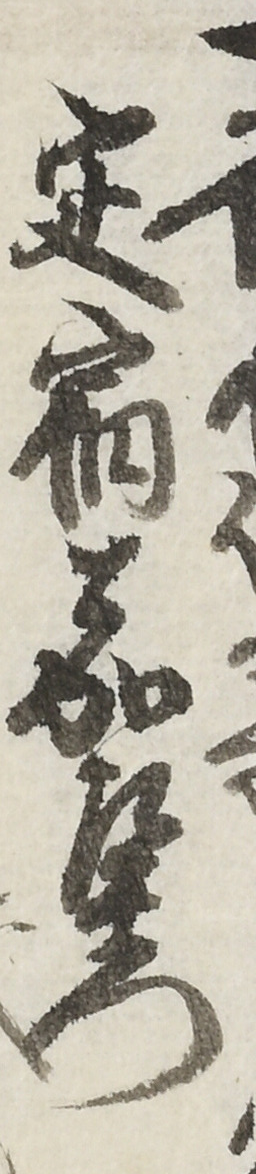定宿嘉左衛門
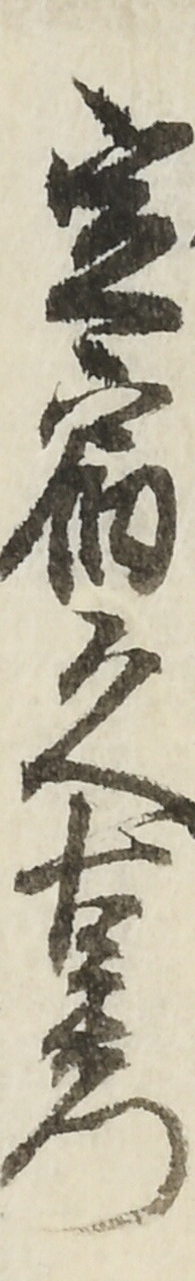定宿久右衛門
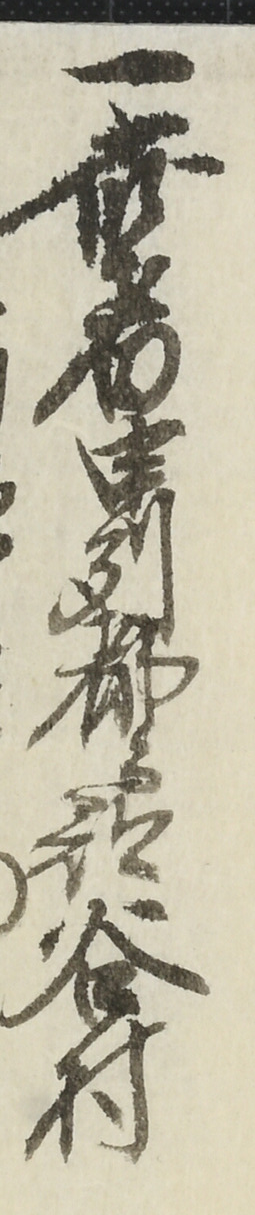一此者甲州都留郡谷村
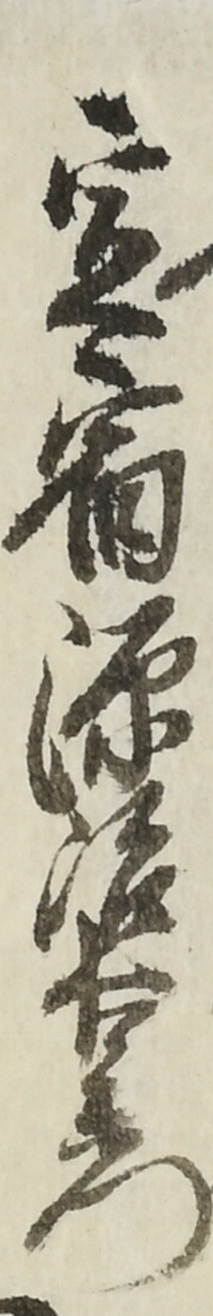定宿源治右衛門

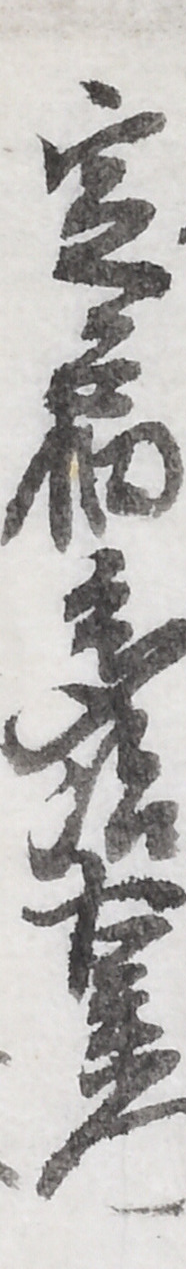定宿多治右衛門
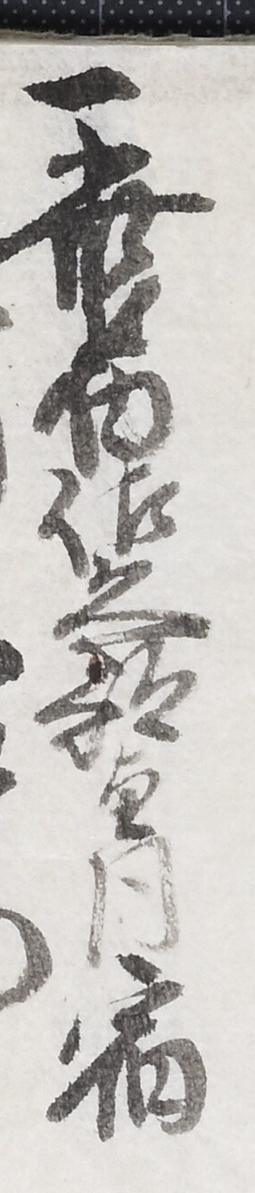一此者佐久郡望月宿
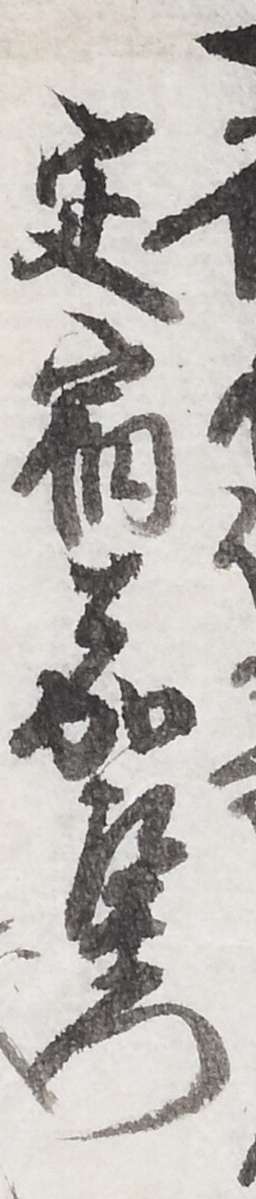定宿嘉左衛門
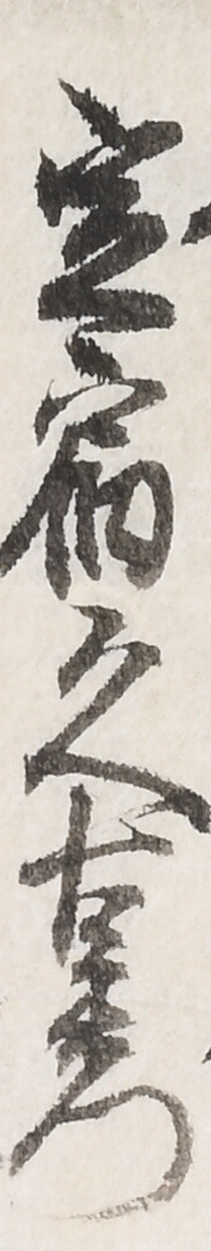定宿久右衛門
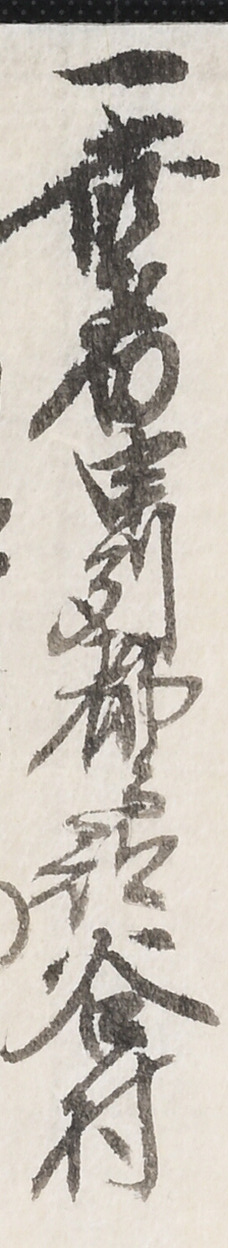一此者甲州都留郡谷村
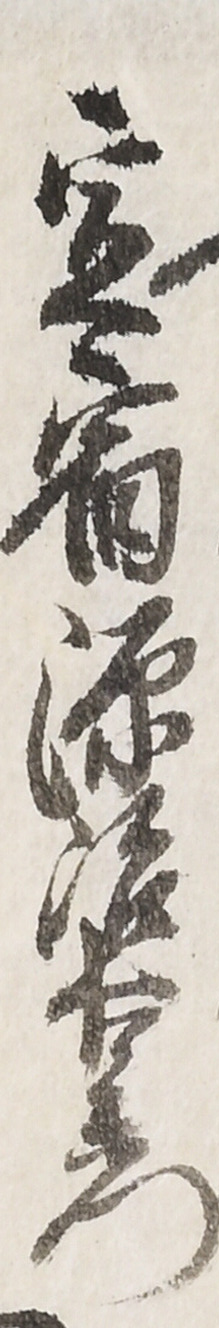定宿源治右衛門
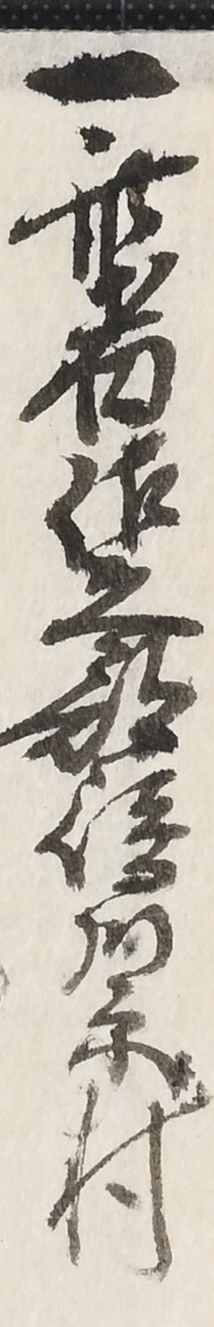一此者佐久郡島川原村
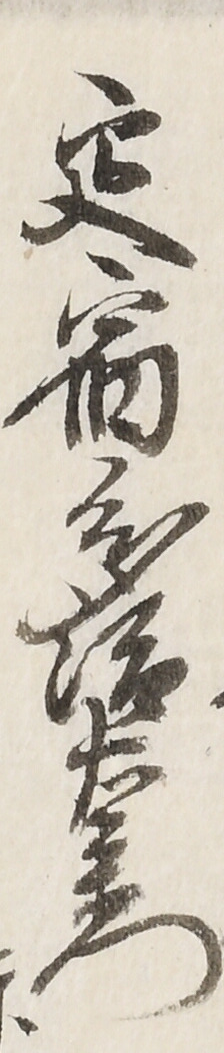定宿多治右衛門
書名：安政七庚申年正月他国石切名前書上帳
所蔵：伊那市立高遠町図書館・合同会社AMANE
